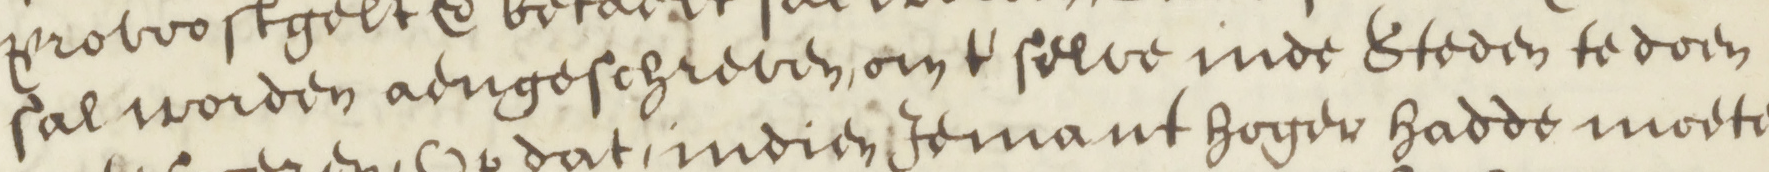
sal worden aengeschreven om 't selve inde Steden te doen
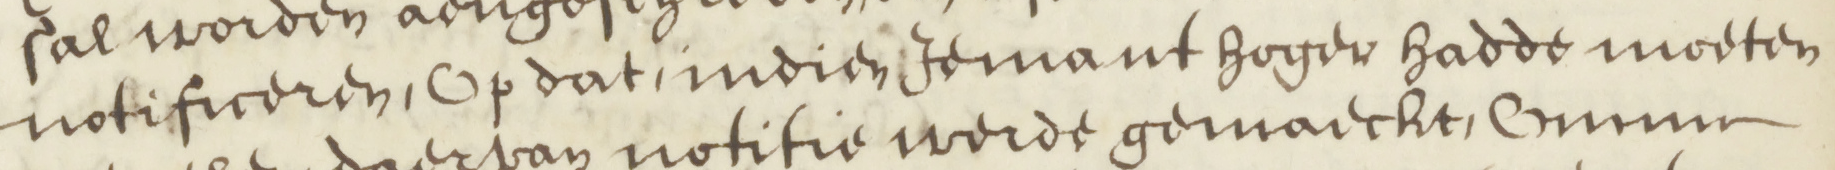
notificeren, Op dat, indien Iemant hoger hadde moeten
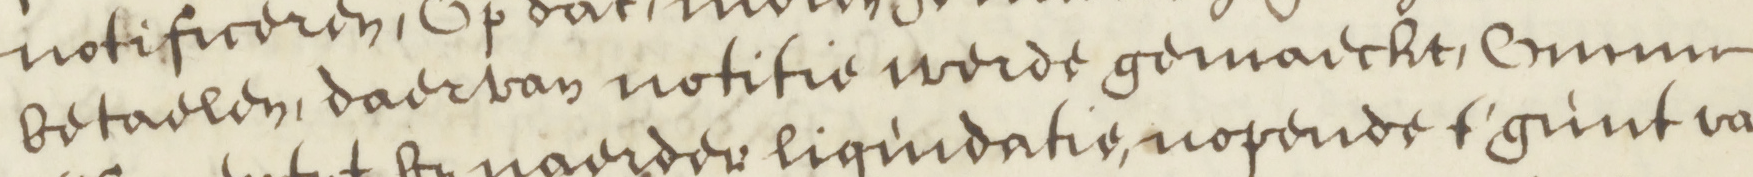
betaelen, daervan notitie werde gemaeckt, Omme
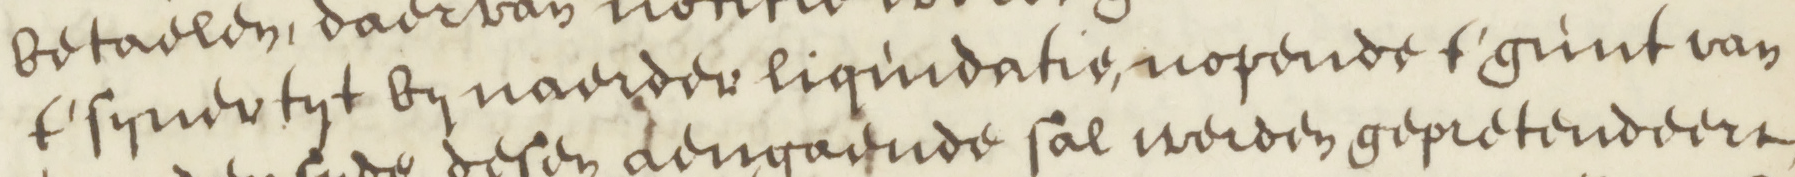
t'syner tyt by naerder liquidatie nopende 't gunt van
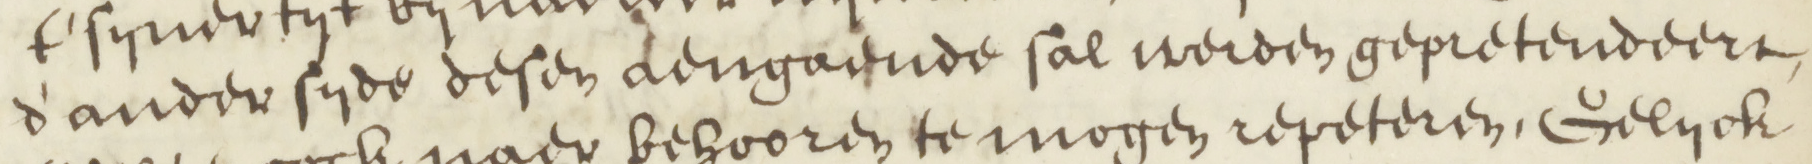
d'ander syde desen aengaende sal worden gepretendeert
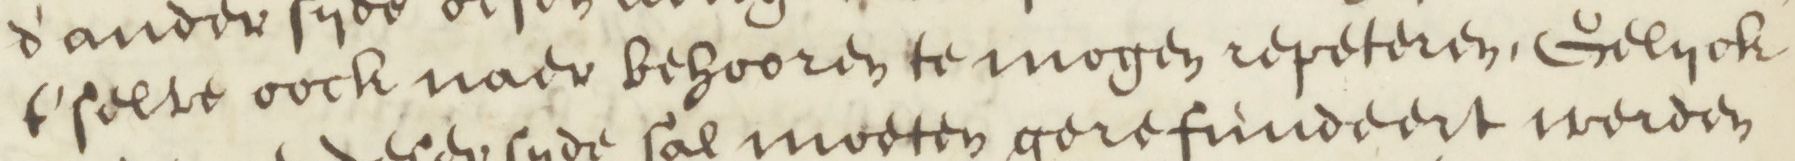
't selve oock naer behooren te mogen repeteren, Gelijck
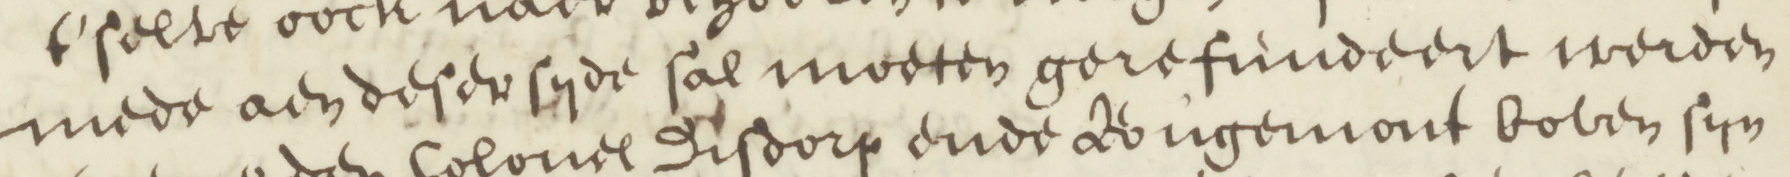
mede aen deser syde sal moeten gerefundeert worden
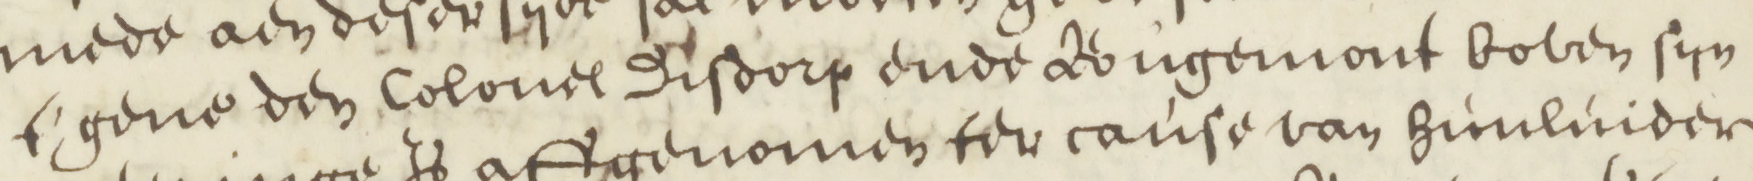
t'gene den colonel Disdorp ende Rugemont boven syn
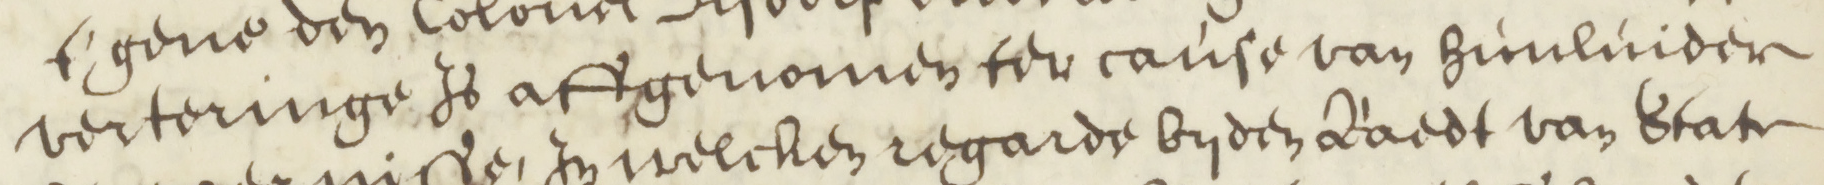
verteringe Is affgenomen ter cause van hunluiden
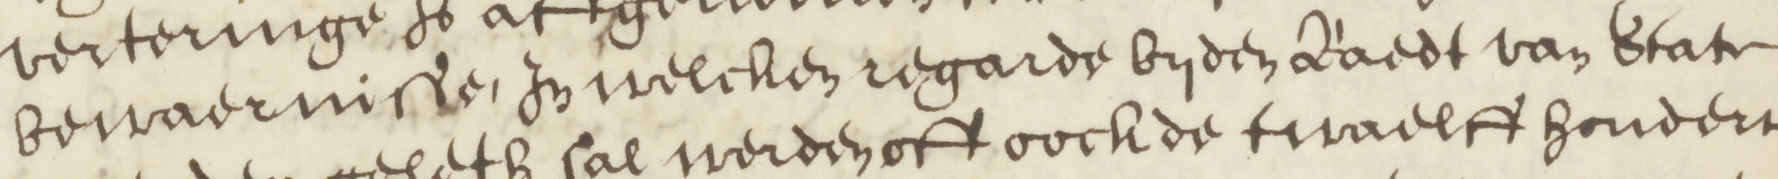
bewaernisse. In welcken regarde byden Raedt van State
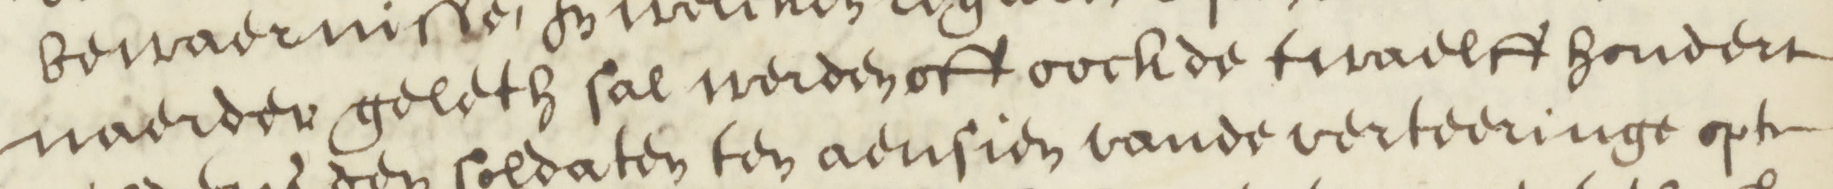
naerder geleth sal werden off oock de twaelff hondert
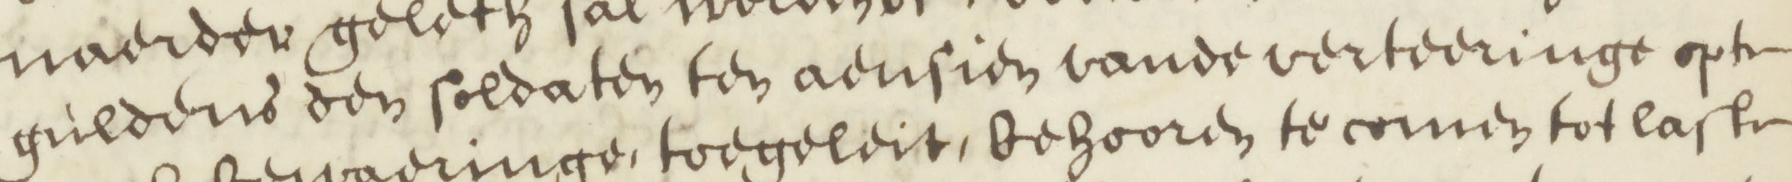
guldens den soldaten ten aensien vande verteeringe opte
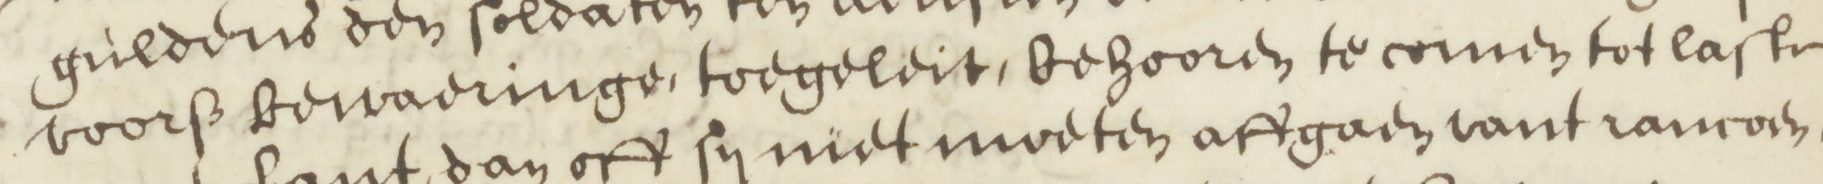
voors bewaeringe toegeleit, behooren te comen tot laste
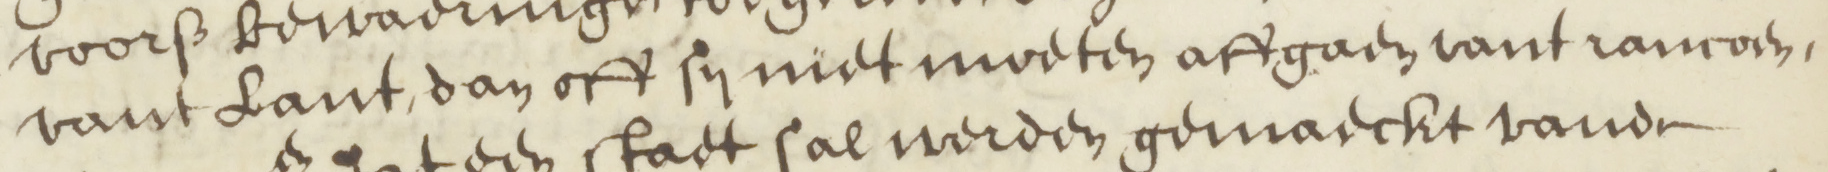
vant Lant dan off sy niet moeten affgaen vant rancoen.
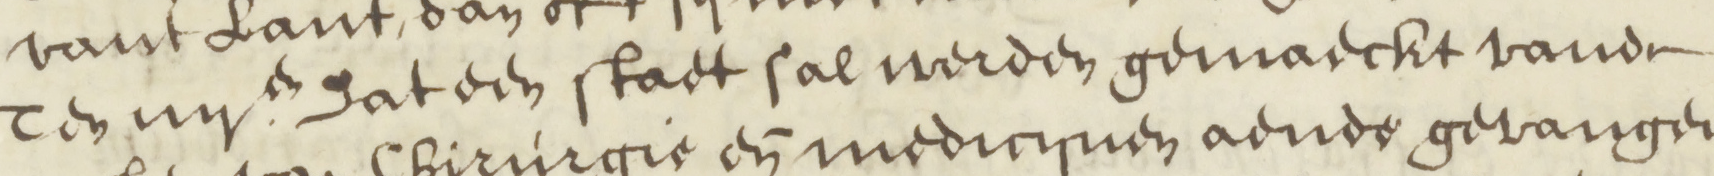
Ten iiije dat een staet sal werden gemaeckt vande
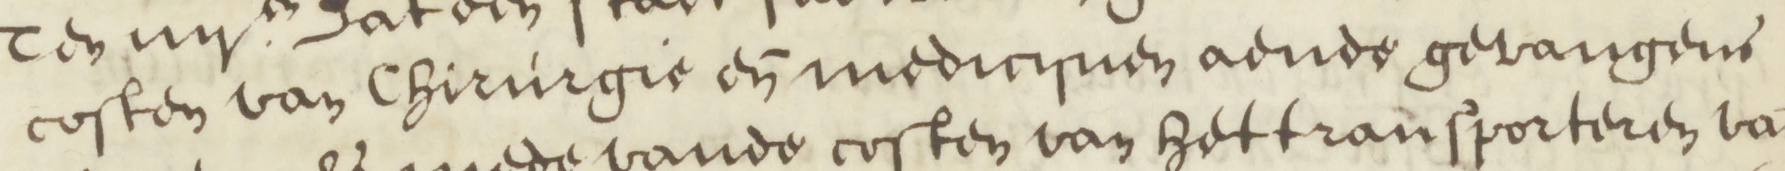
costen van chirurgie en medicynen aende gevangens
